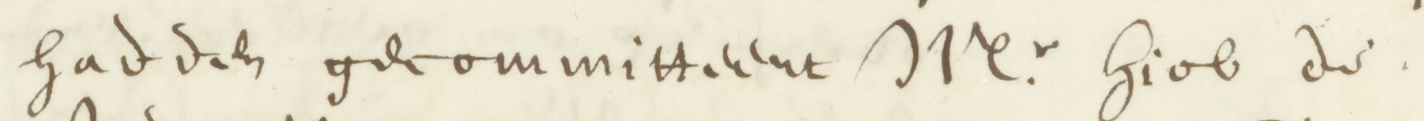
hadden gecommitteert Mr. hiob de
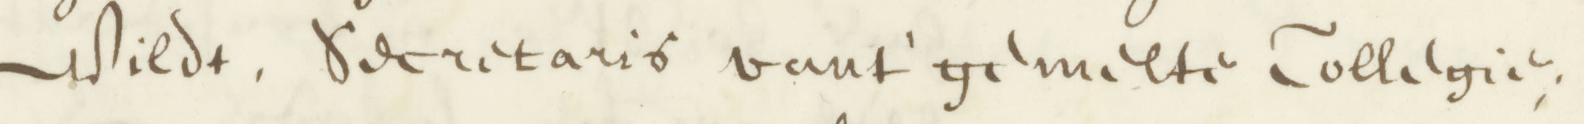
Wildt, Secretaris vant' gemelte Collegie;
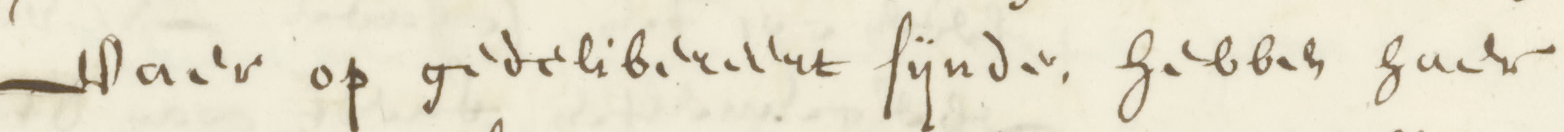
Waer op gedelibereert sijnde, hebben haer
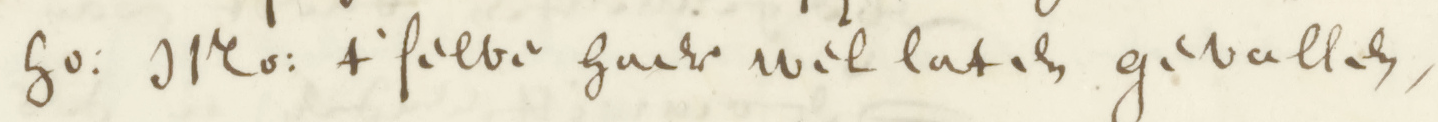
ho:Mo: t'selve haer wel laten gevallen.
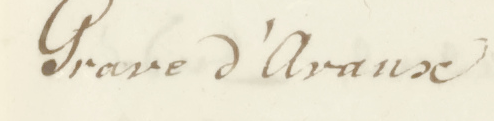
Grave d'Avaux
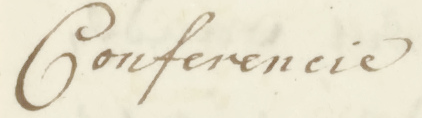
Conferencie
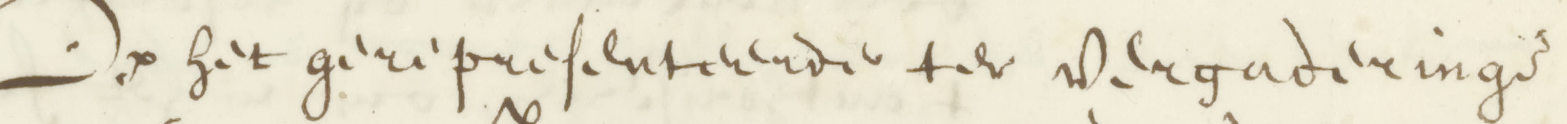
Op het gerepresenteerde ter Vergaderinge
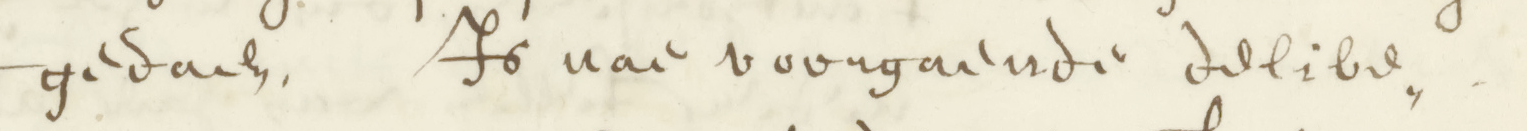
gedaen, Is nae voorgaende delibe,,
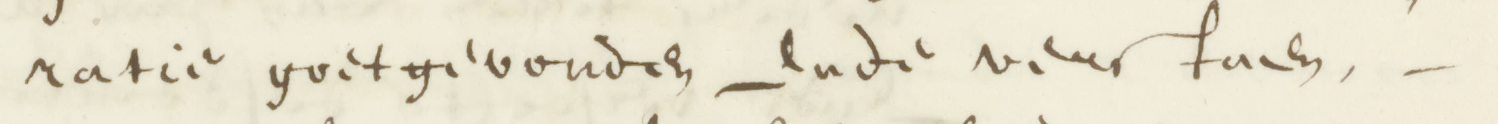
ratie goetgevonden Ende verstaen, -
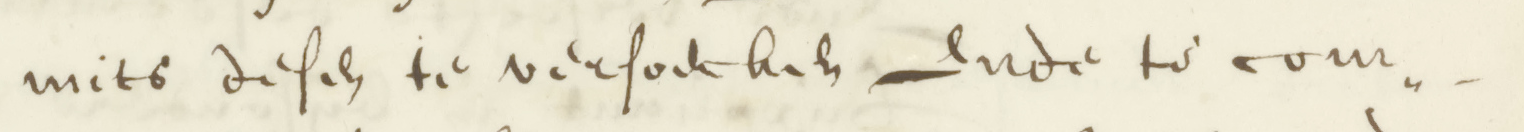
mits desen te versoecken Ende te com,, -
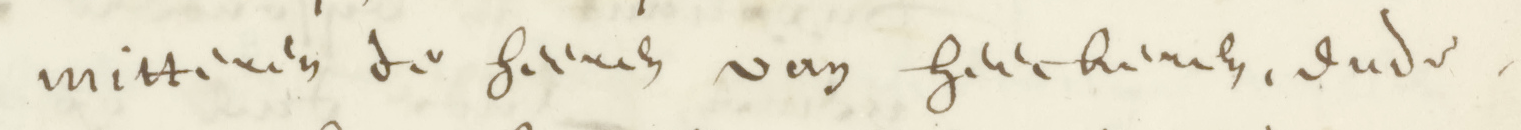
mitteren de heeren van heeckeren, ende
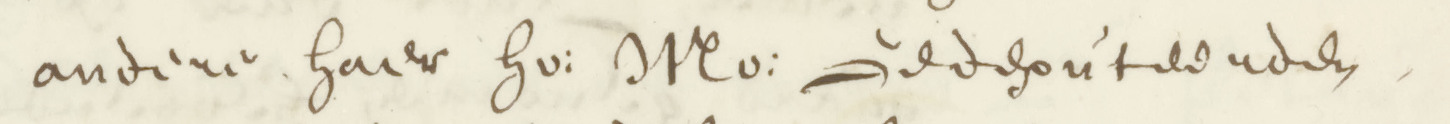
andere haer ho:Mo: Gedeputeerden
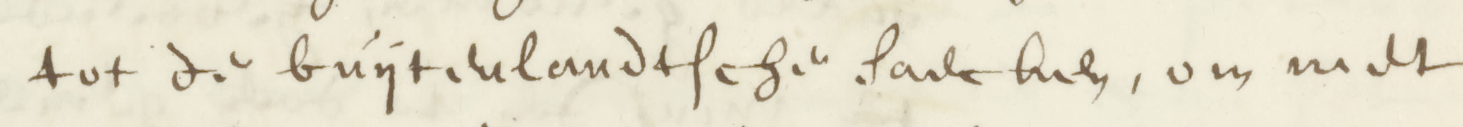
tot de buijtenlandtsche saecken, om met
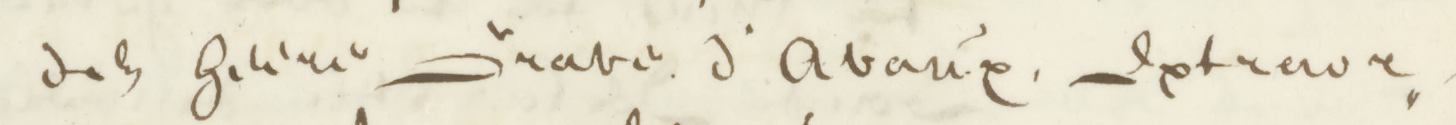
den heere Grave d'Avaux, Extraor„
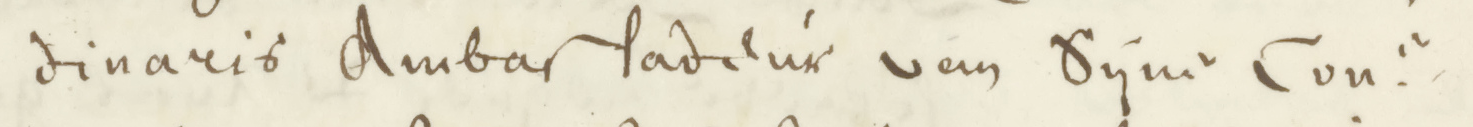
dinaris Ambassadeur van Sijne Cone.
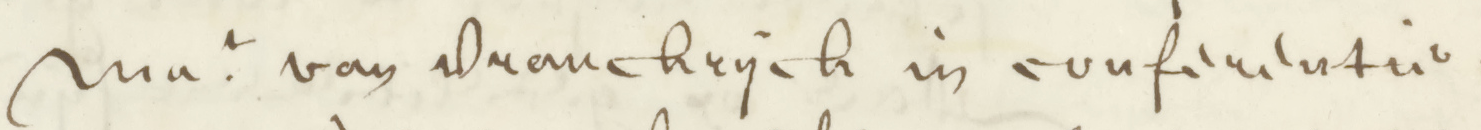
Mat. van Vranckrijck in conferentie
